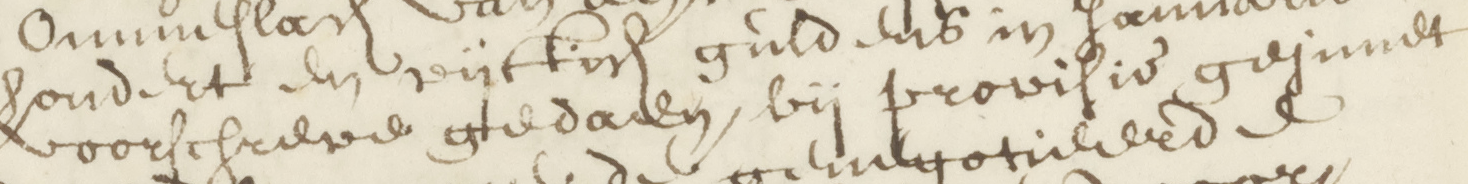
voorschreve gedaen, bij provisie geinnet
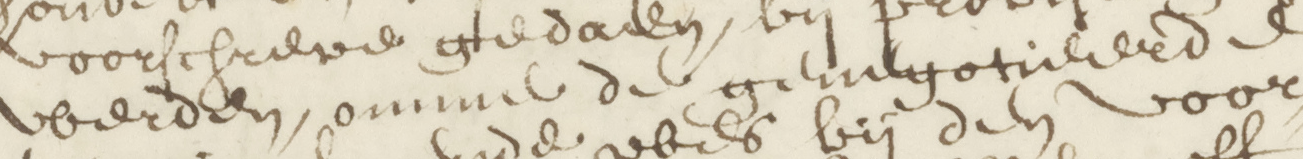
werden, omme de genegotieerde
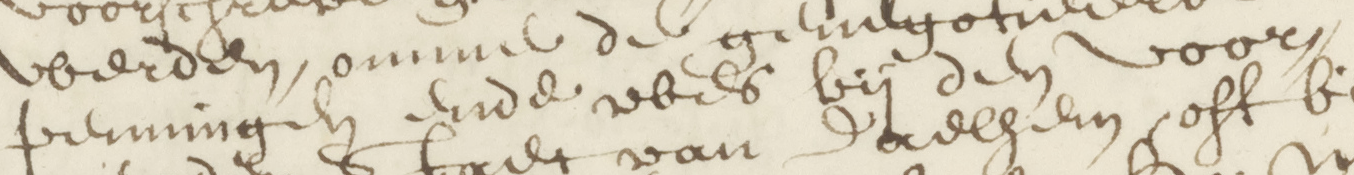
penningen ende wes bij den voor„
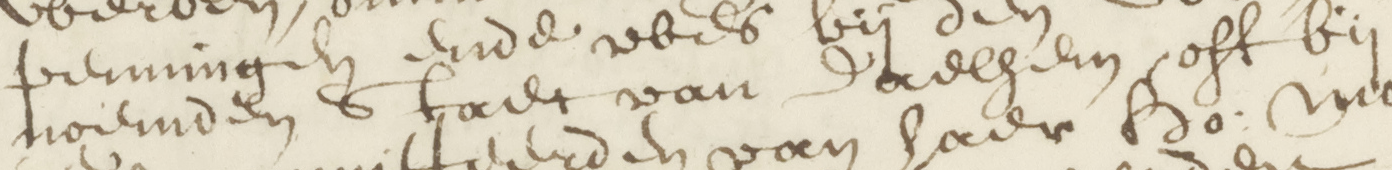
noemden Staet van Daelhem, off bij
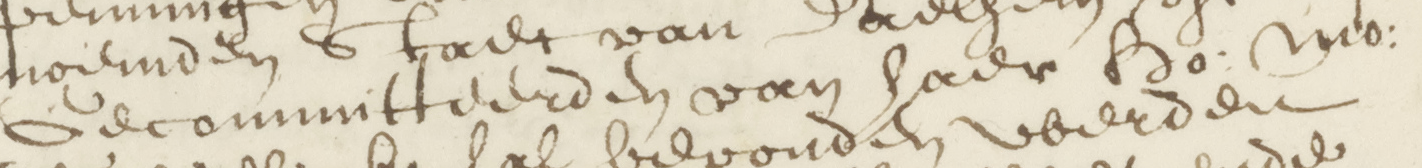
Gecommitteerden van haer ho:Mo:
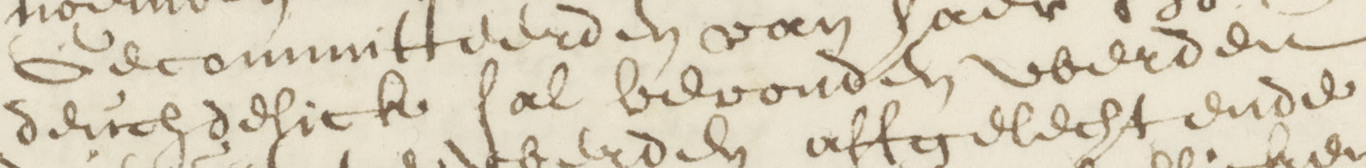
deuchdelick sal bevonden werden
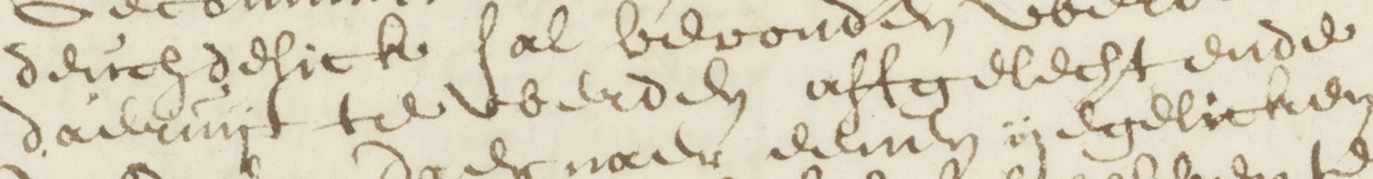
daeruijt te werden, affgelecht ende
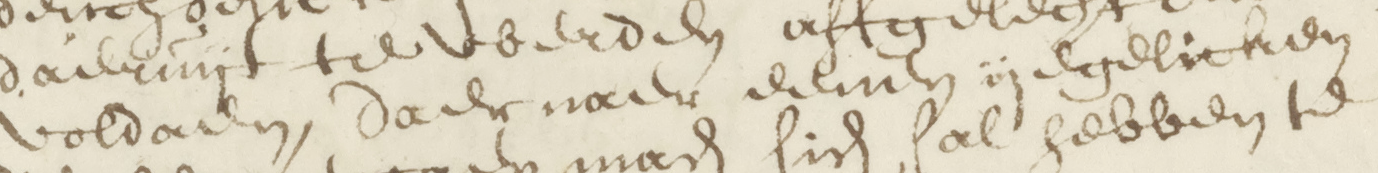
voldaen, daer naer eenen ijegelicken
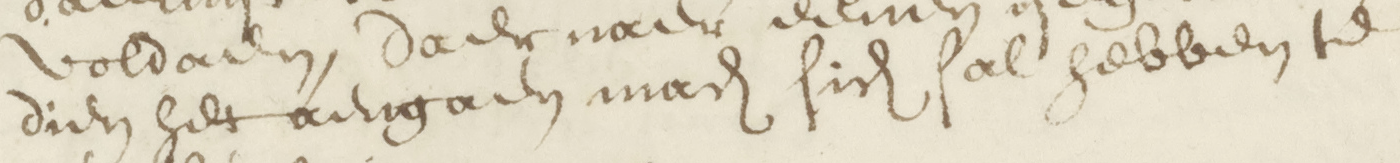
dien het aengaen mach sich sal hebben te
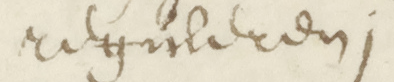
reguleren.
